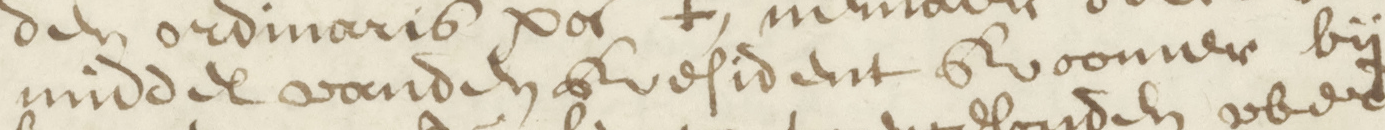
middel vanden Resident Roomer bij
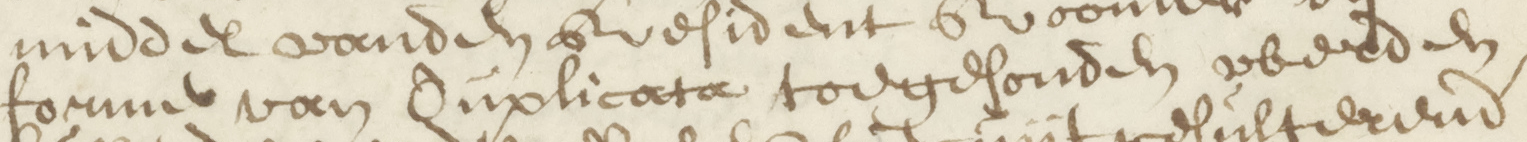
forme van duplicata toegesonden werden,
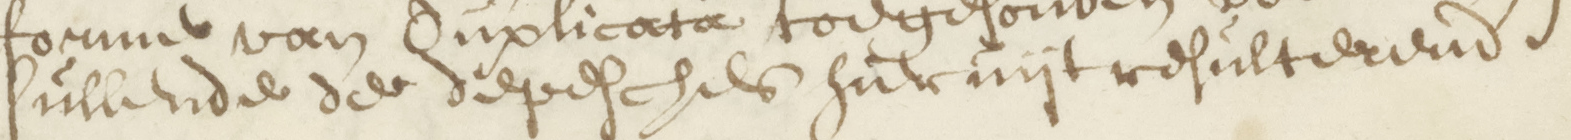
sullende de depesches hier uijt resulterende
